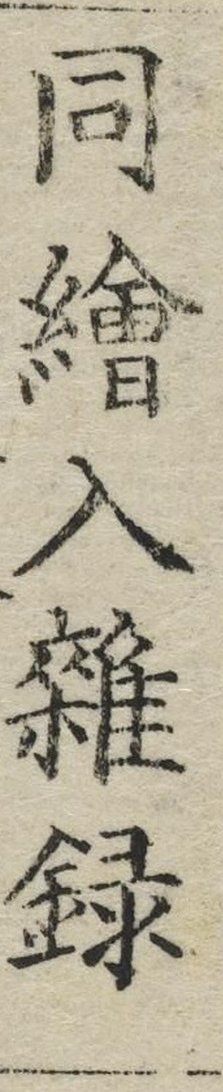同繪入雜録
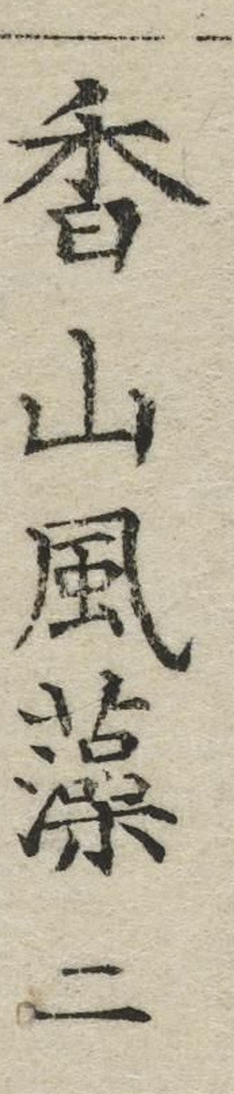香山風藻ニ
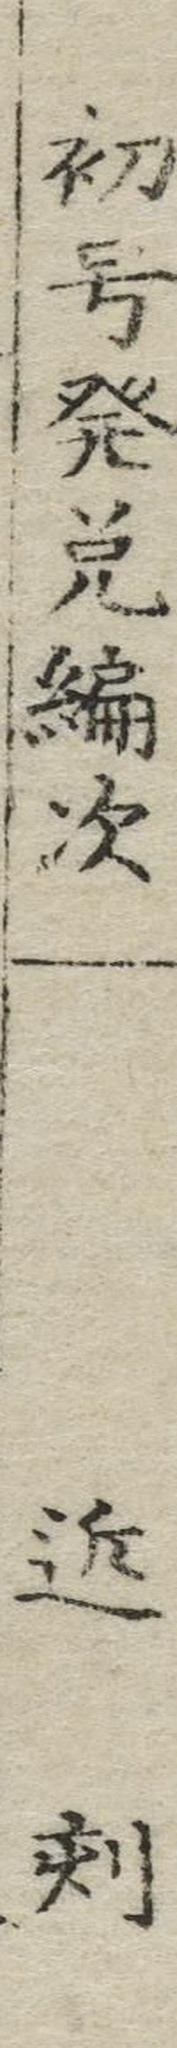初号発兑編次
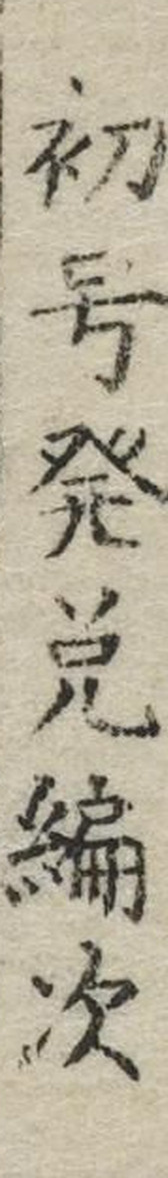初号発兑編次
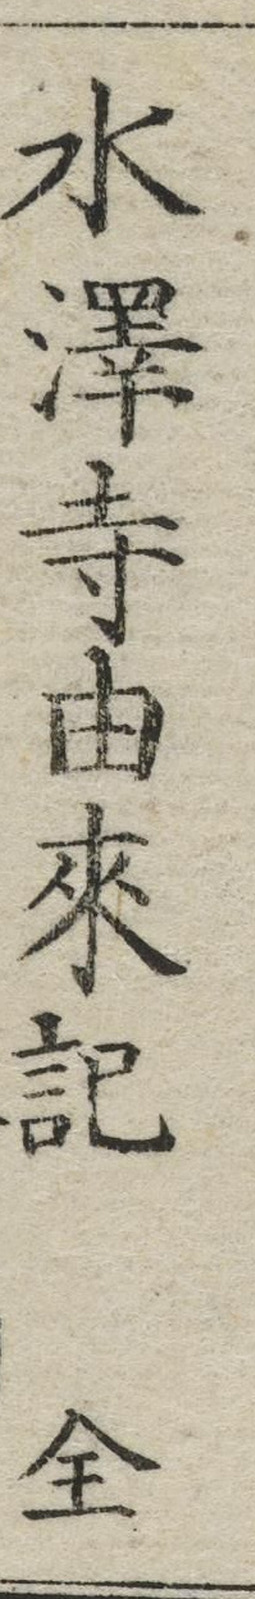水澤寺由來記全
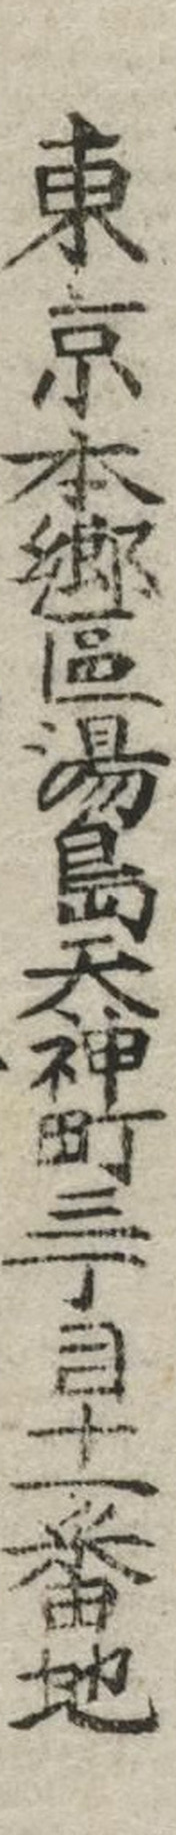東京本郷區湯島天神町三丁目十一番地
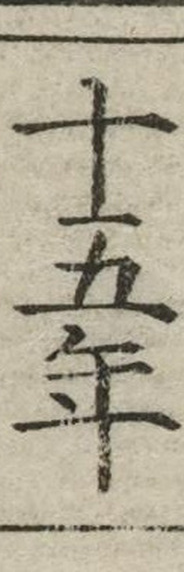十五年
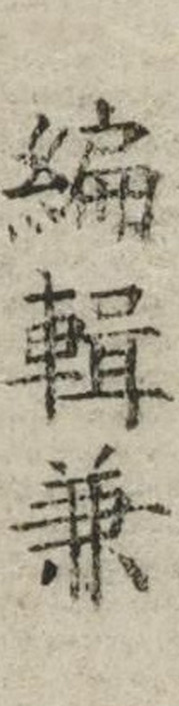編輯兼
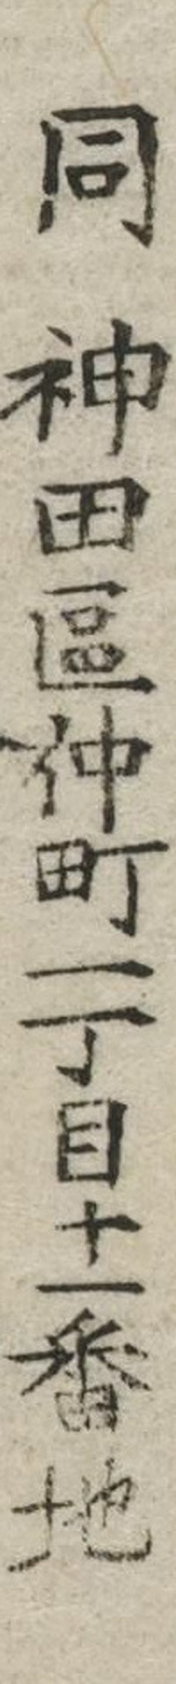同神田區仲町一丁目十一番地
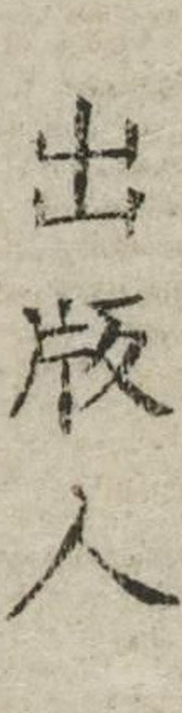出版人
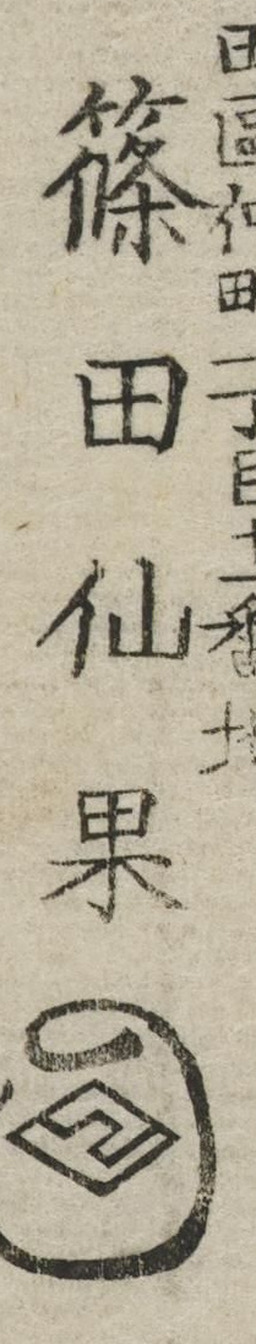篠田仙果
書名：上州伊香保鑛泉圖會　全
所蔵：東京大学地震研究所図書室 Earthquake Research Institute Library, The University of Tokyo, JAPAN
